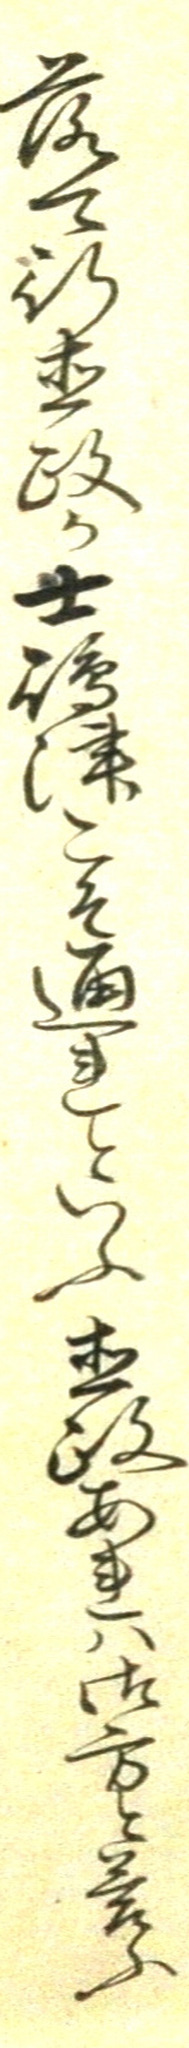落て行直政か士島津こそ通れといふ直政あれは御方と答ふ
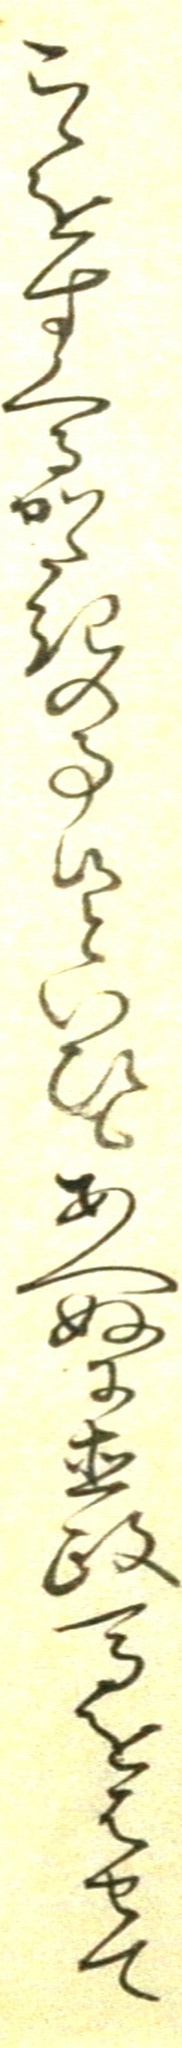こゝをすくるかたきの事候といひもあへぬに直政馬をはせて
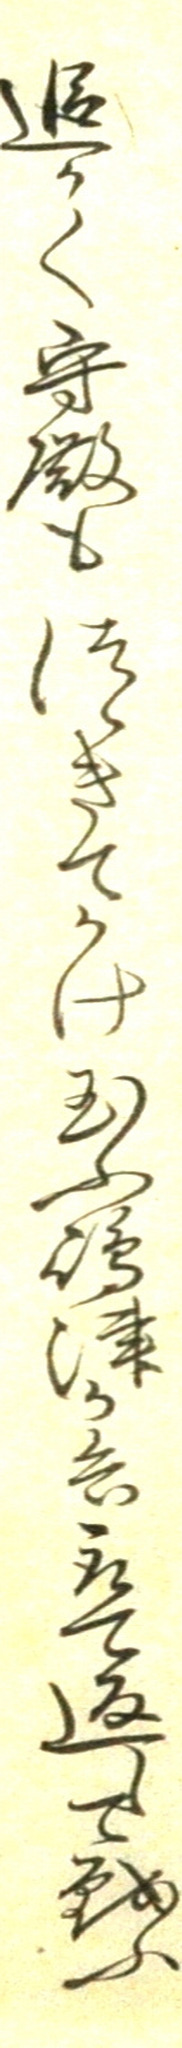追かく守殿もつゝきてかけ玉ふ島津か兵取て返して戦ふ
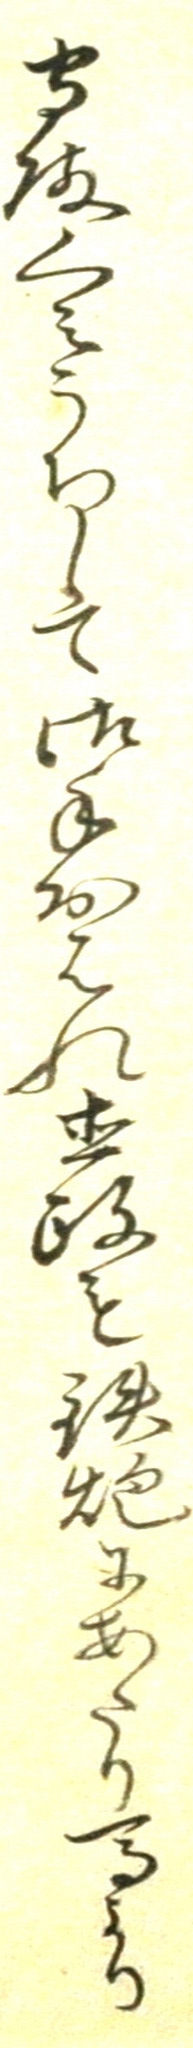守殿くみうちして御手おはれ直政も鉄炮にあたり馬より
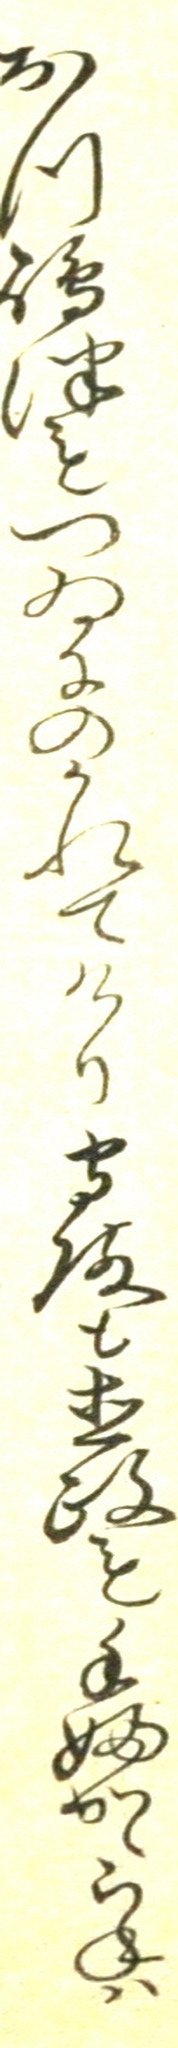おつ島津もつゐにのかれてけり守殿も直政も手ふかゝらねは
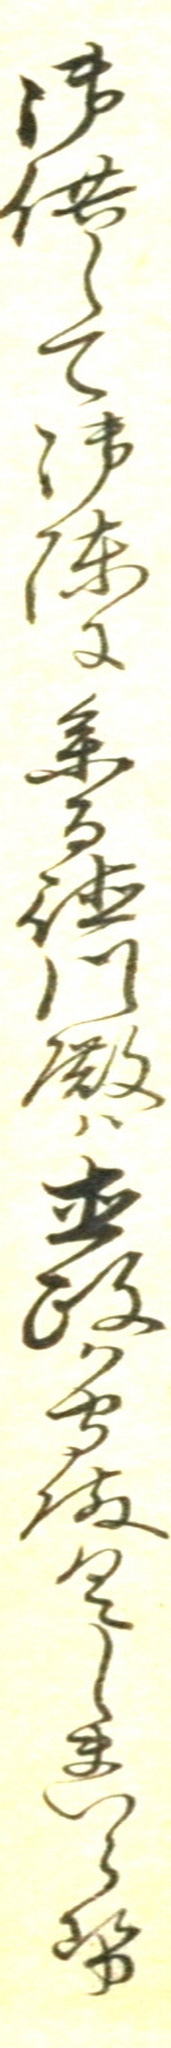御供して御陣に参る徳川殿は直政か守殿具しまいらせ
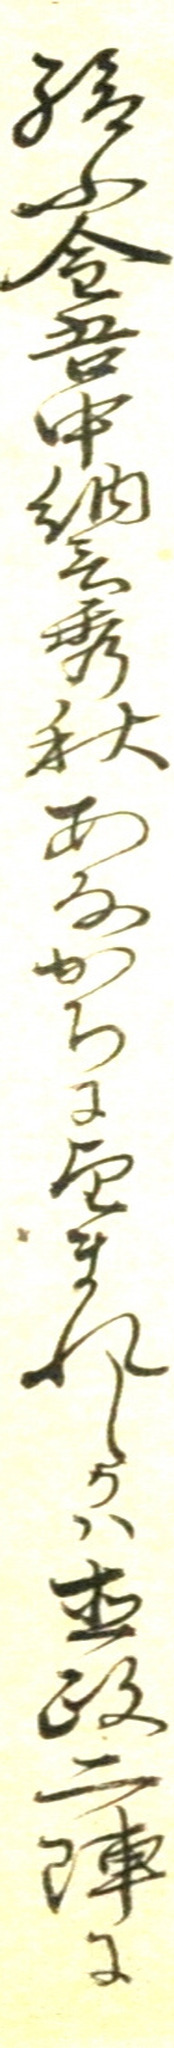給ふ金吾中納言秀秋あなかちに望まれしかは直政二陣に
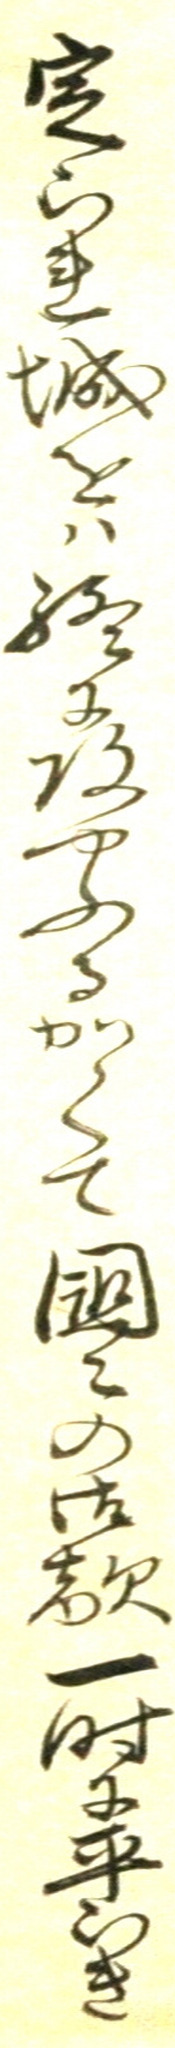定られ城をは終に攻やふるかくて国々の御敵一時に平らき
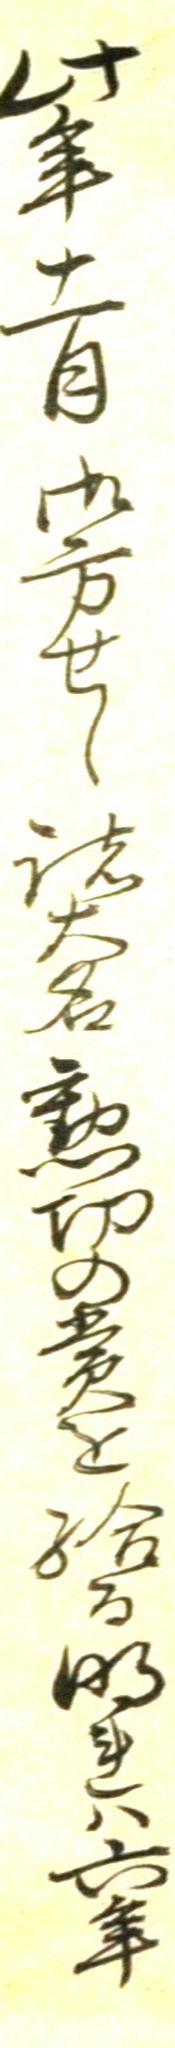此年十一月味方せし諸大名勲功の賞を給る明れは六年

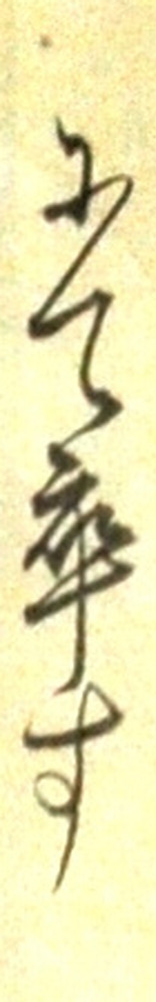にて卒す
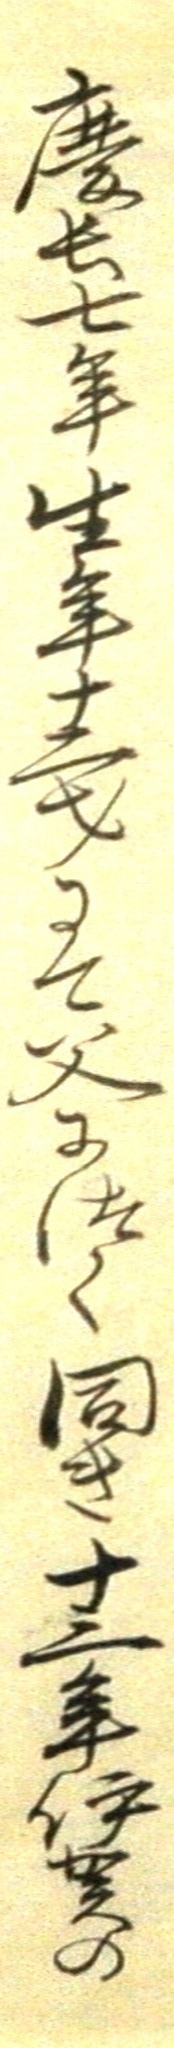慶長七年生年十二才にて父につく同き十三年伊賀の
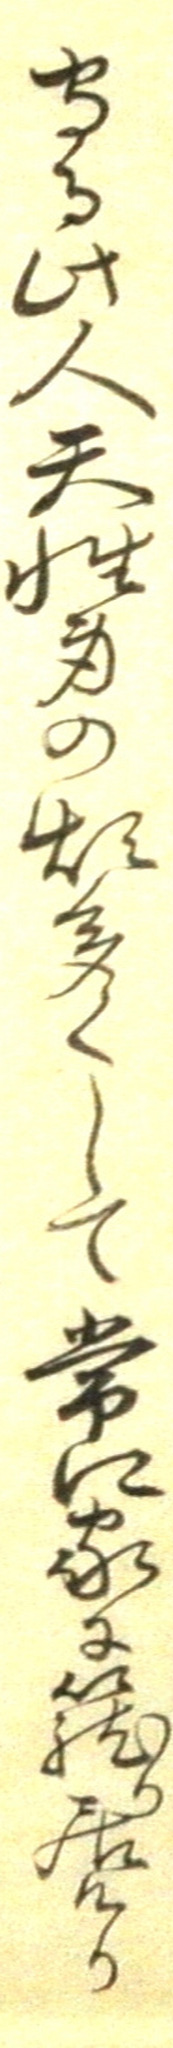守る此人天性身の煩多くして常に家に籠り居けり
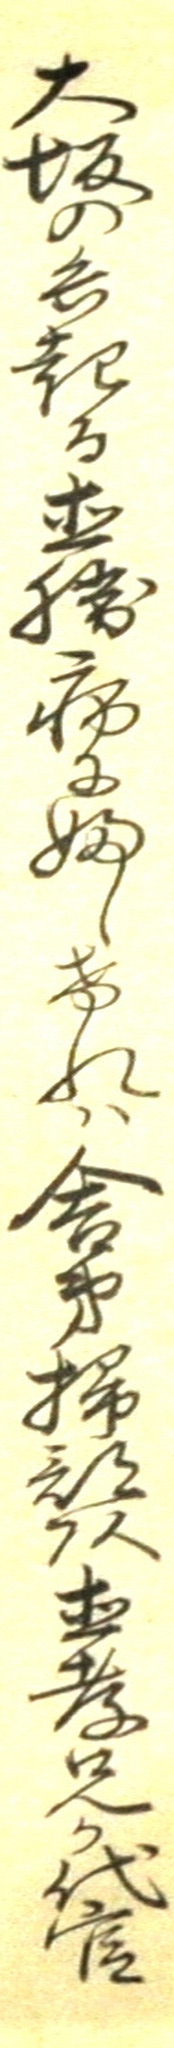大坂の兵起る直勝病にふしけれは舎弟掃部頭直孝兄か代官
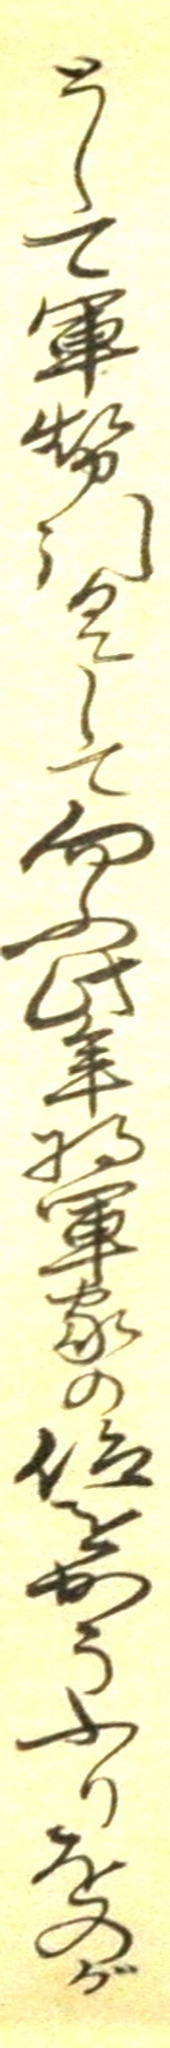として軍勢引具して向ふ此年将軍家の仰をかうふりをのが
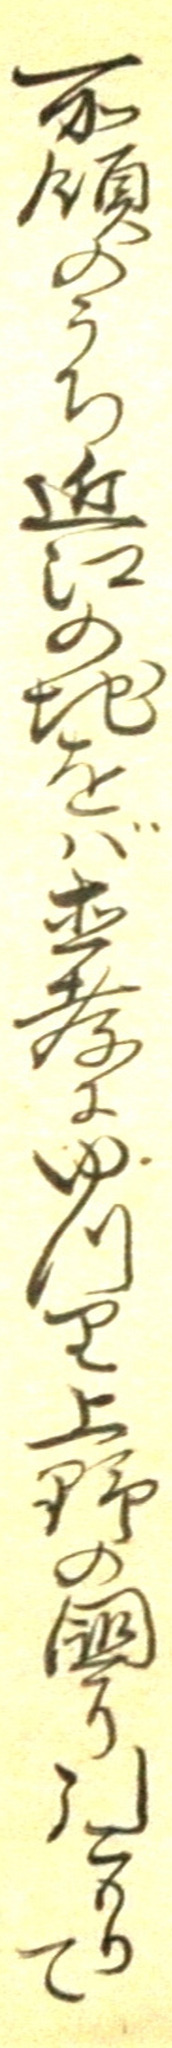所領のうち近江の地をば直孝にゆつり上野の国に引こもりて
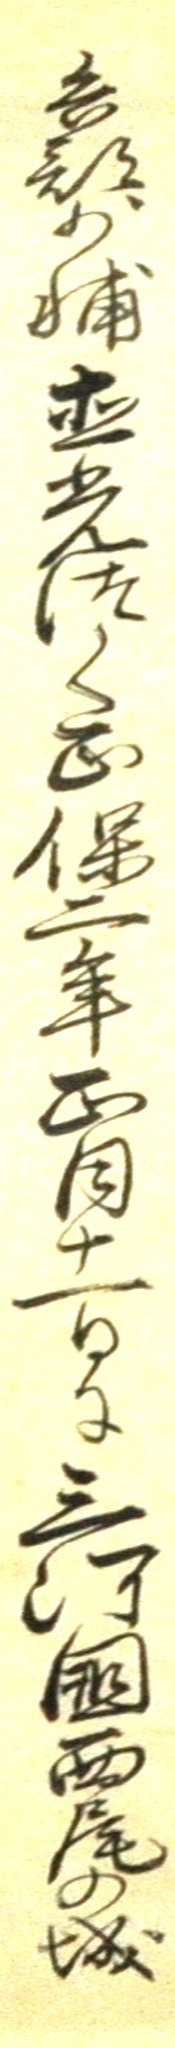兵部少輔直光つく正保二年正月十一日に三河国西尾の城
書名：藩翰譜（四・上）
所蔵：伊那市立高遠町図書館・合同会社AMANE
